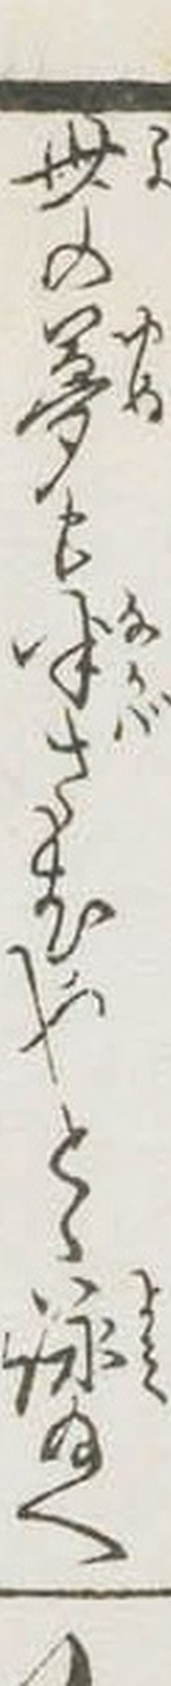世の夢も半さむやとゝ詠給へ
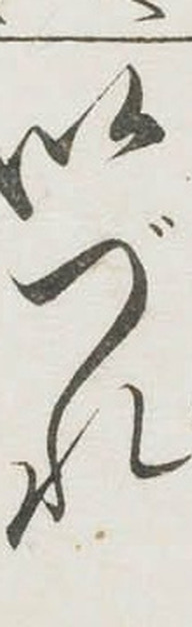いづれ
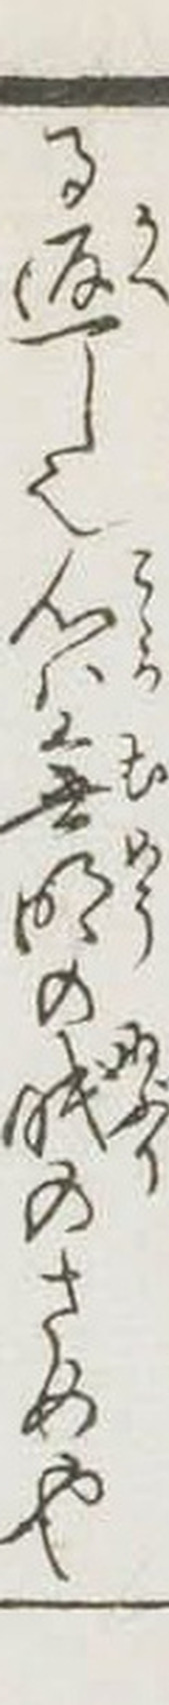る返し也心は無明の眠のさめや
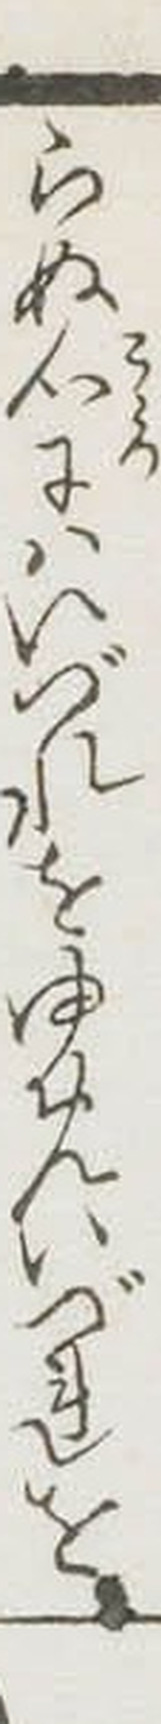らぬ心にはいづれをゆめいづれを
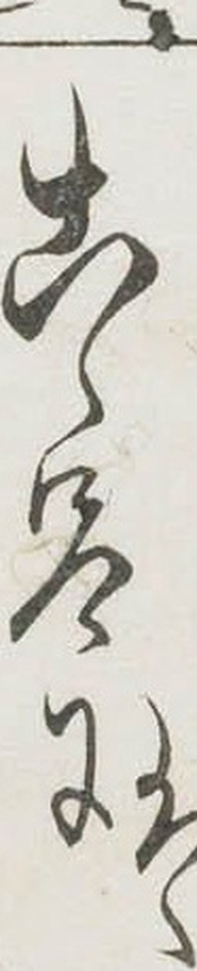こゝろに
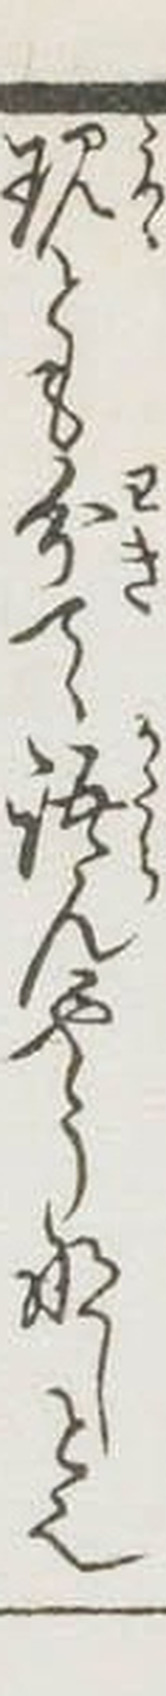現とも分て語んやうなしと也
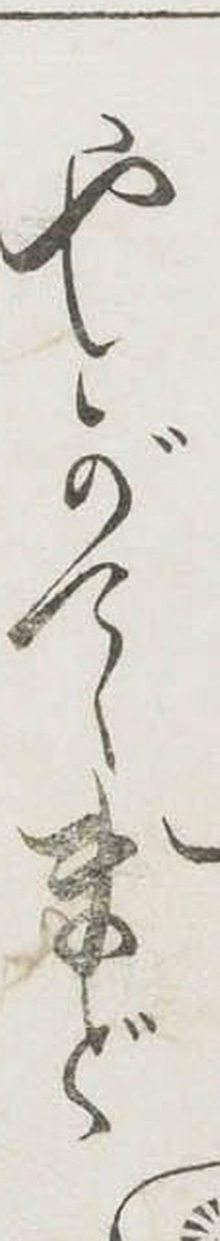やがてまど
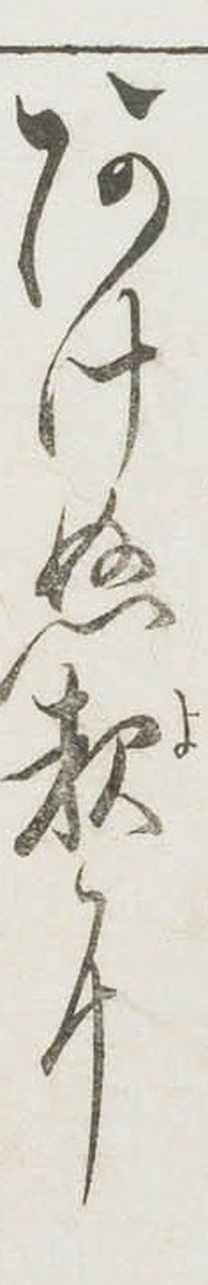あけぬ夜に
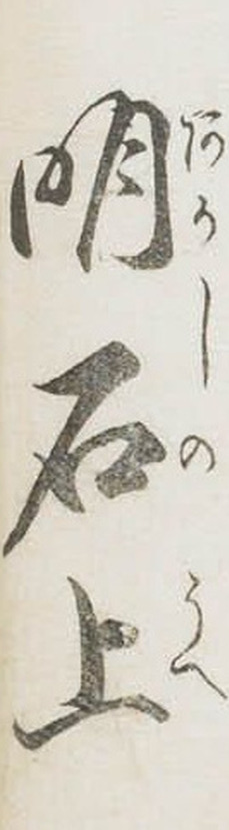明石上
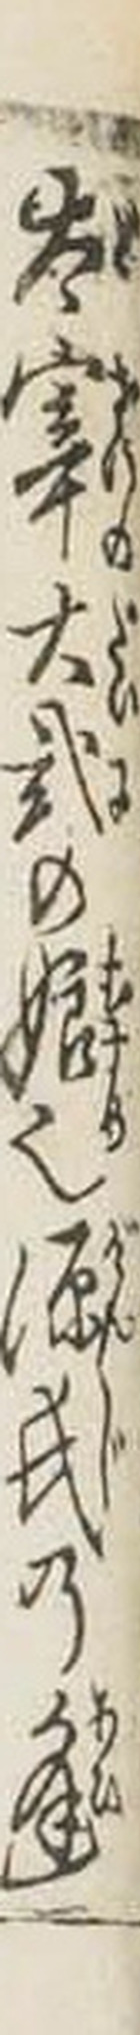太宰大弐の娘也源氏の逢
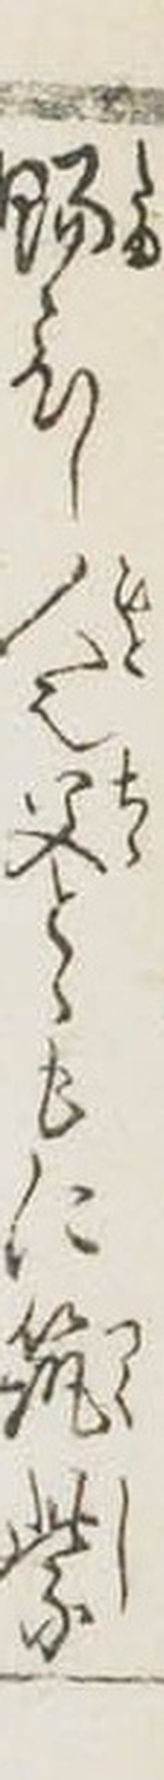賜ひし人也父とゝもに筑紫
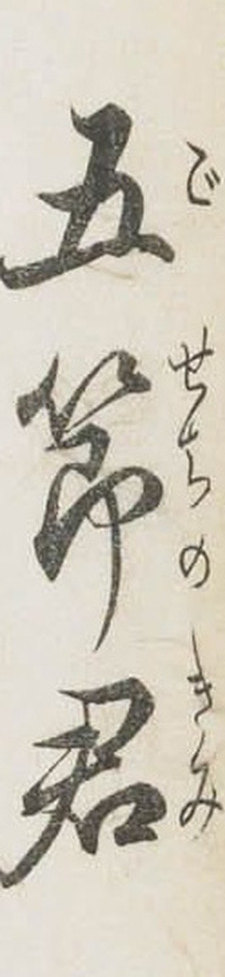五節君
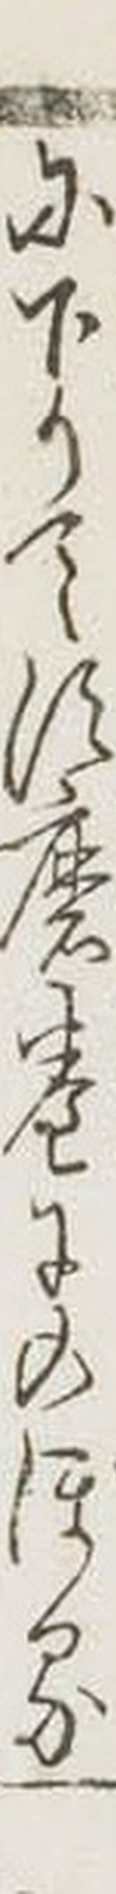に下りて須磨巻にのぼる
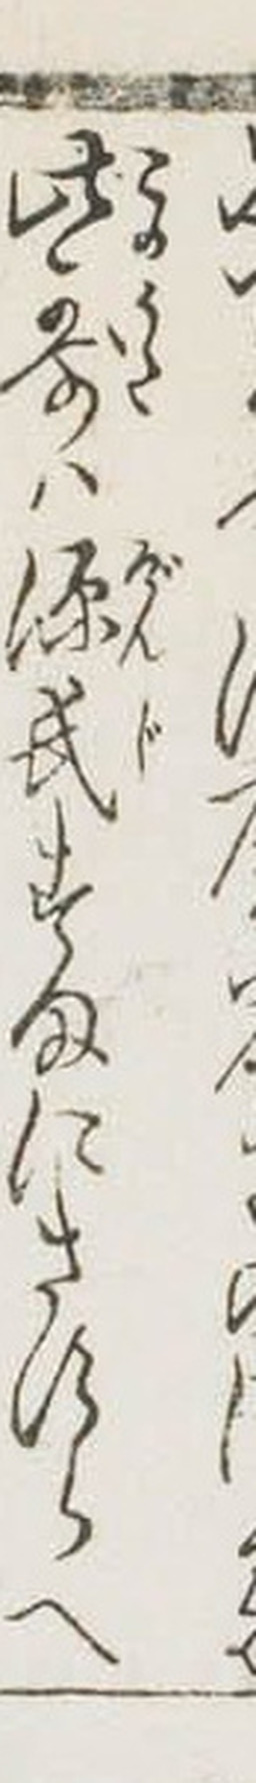此哥は源氏すまにさすらへ
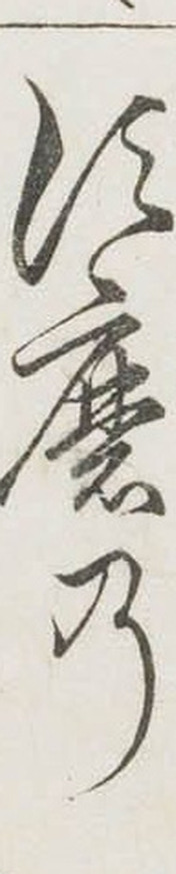須磨の
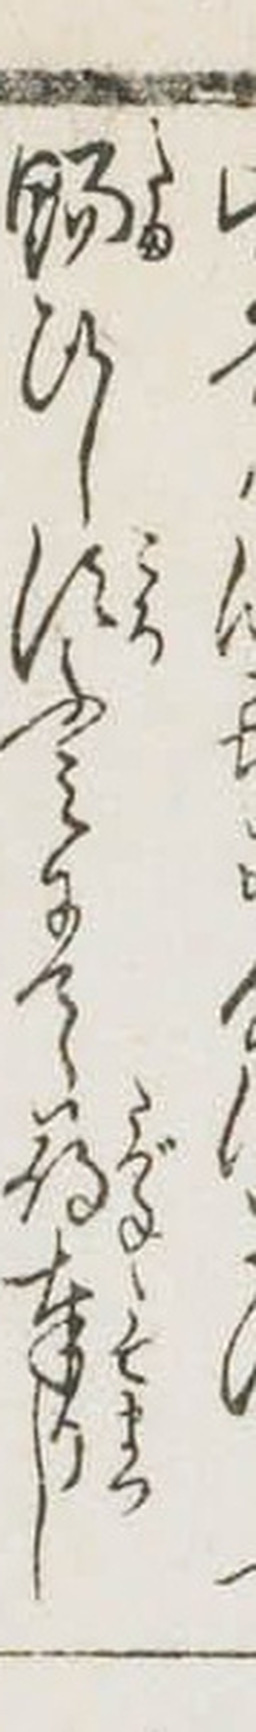賜ひし頃ふみにて尋奉りし
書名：源氏百人一首
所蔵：東京学芸大学教育コンテンツアーカイブ
